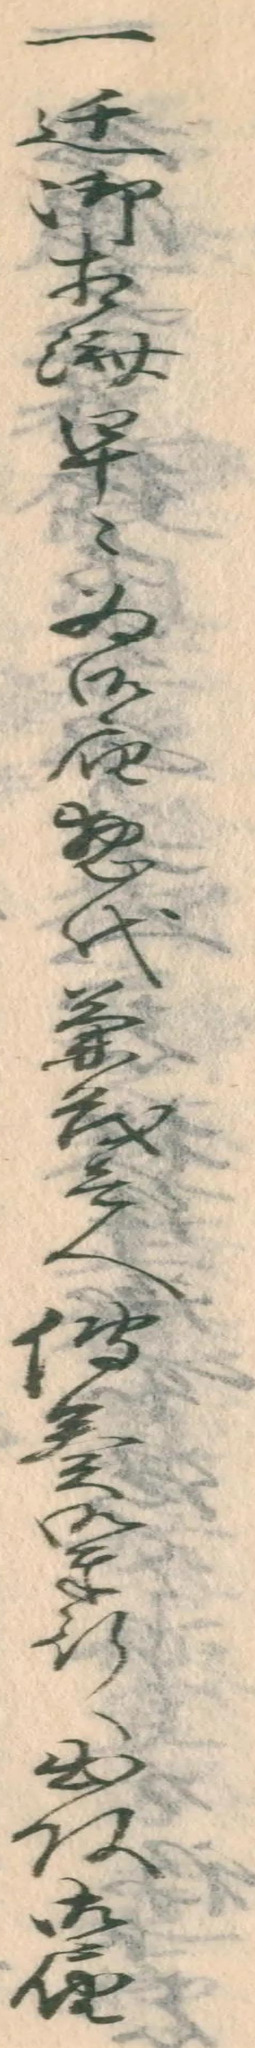一迁御相済早々為御届惣代兼茂壱人伝奏御奉行へ出頭御届
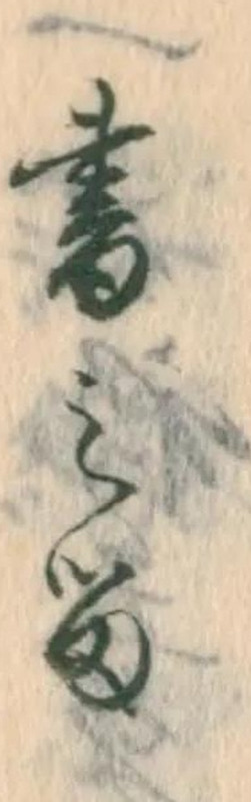書之留
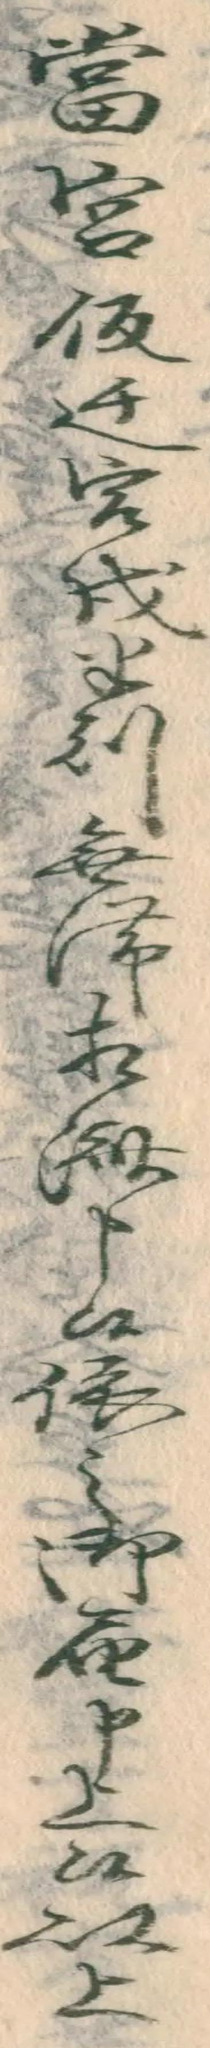当宮仮迁宮戌半刻無滞相済申候依之御届申上候以上
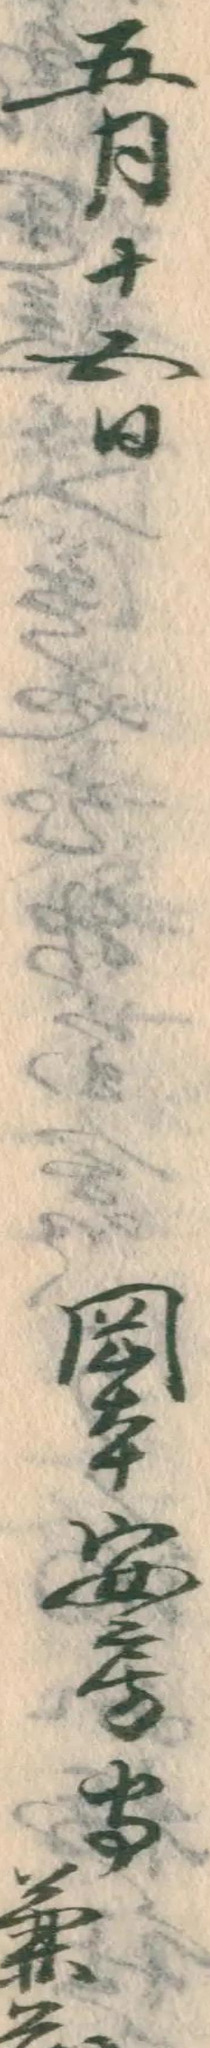五月十五日岡本安房守
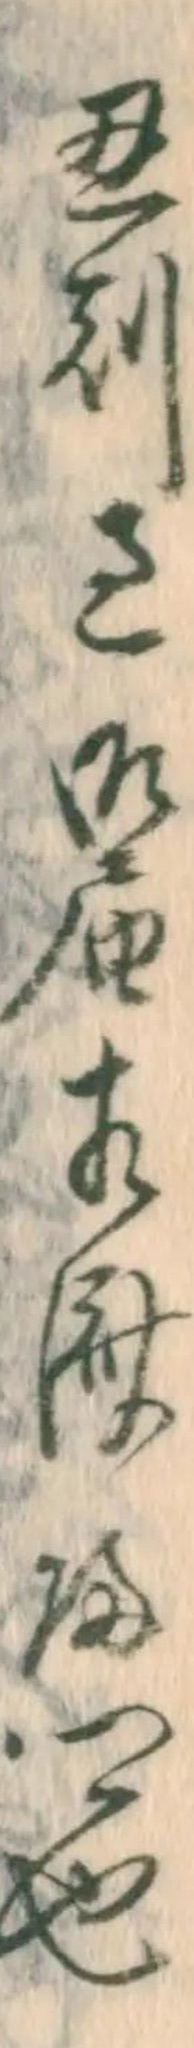丑刻過御届相済帰郷也
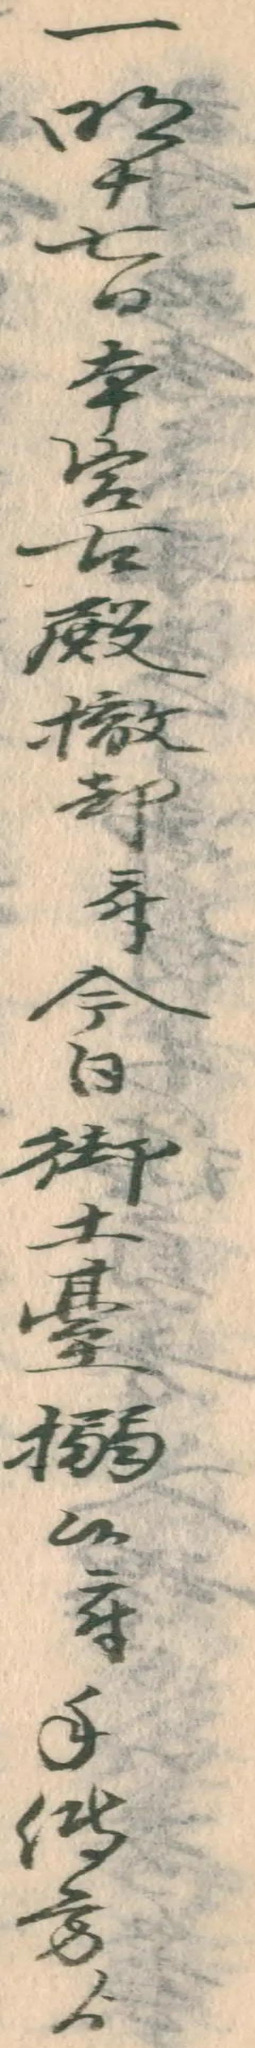一明十七日本宮古殿撤却ニ付今日御土台搦候ニ付手伝方ゟ
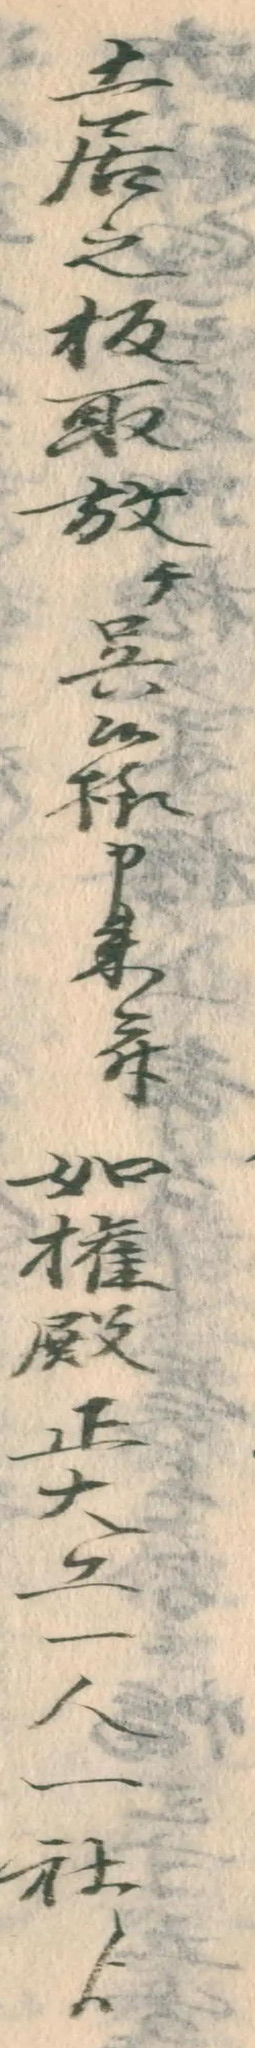土居之板取放チ呉候様申来ニ付如権殿正大工一人一社ゟ
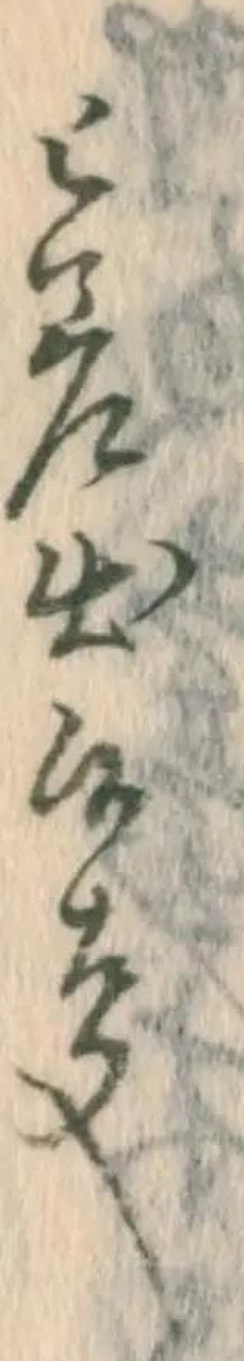被差出候事
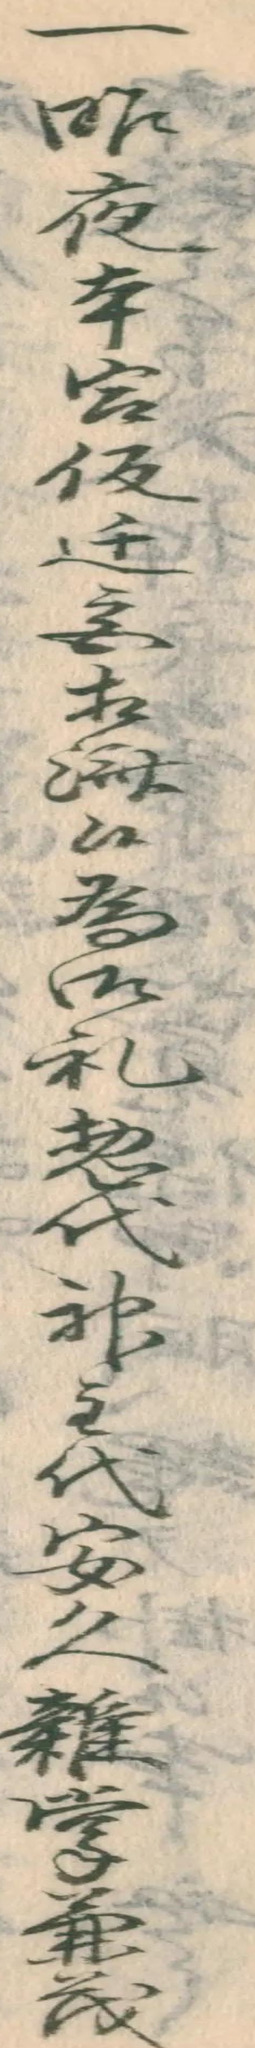一昨夜本宮仮迁宮相済候為御礼惣代神主代安久雑掌兼茂
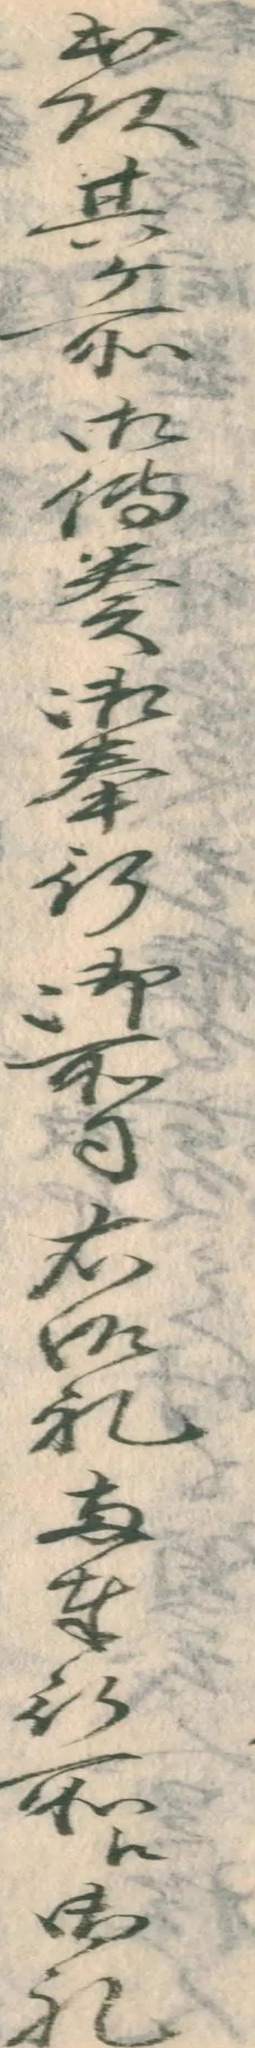出頭其ケ所御伝奏御奉行御所司右御礼両奉行所江御礼
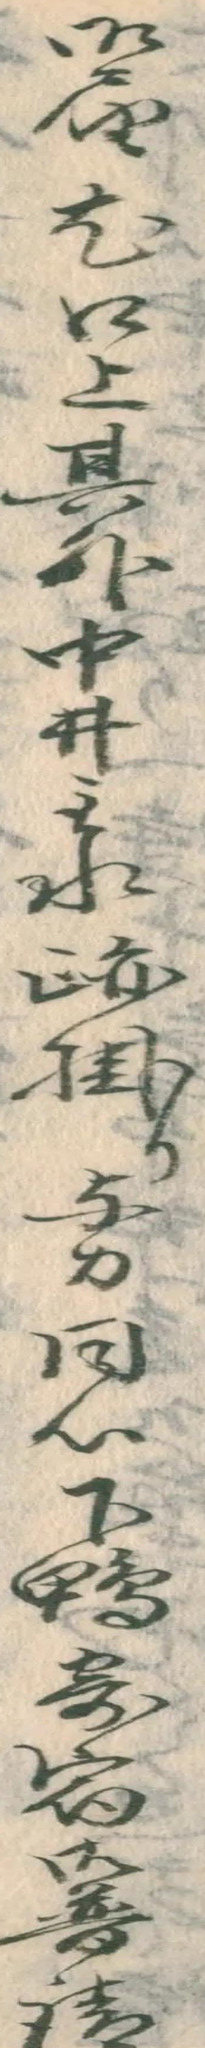御届尤口上其外中井主水跡掛り与力同心下鴨寄宿御普請
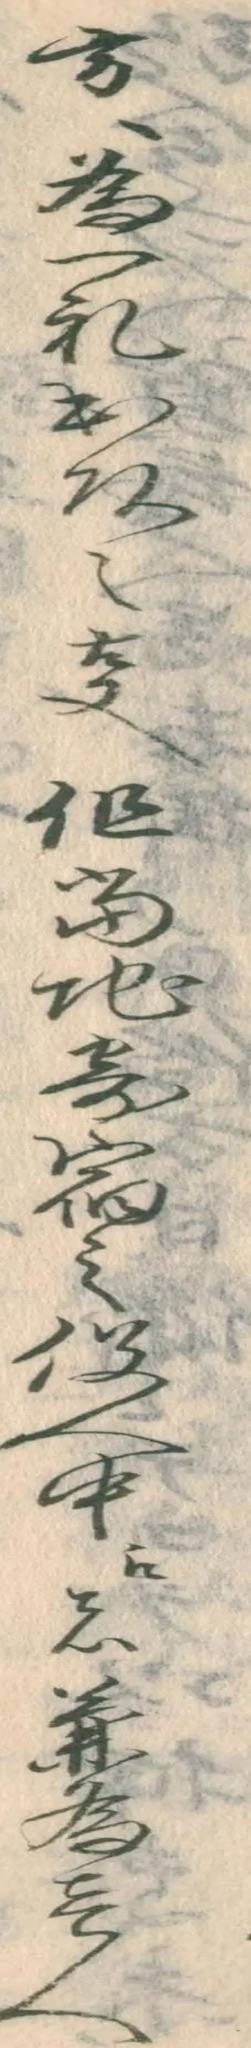方へ為一礼出頭之事但当地寄宿之役人中江は兼為壱人
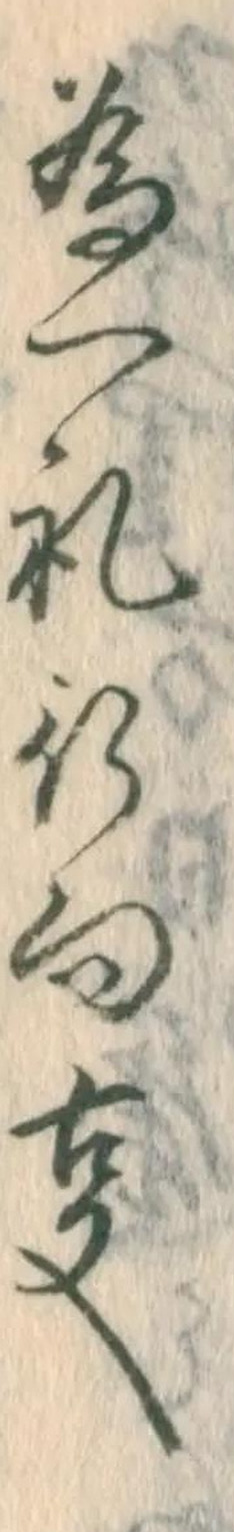為一礼行向事
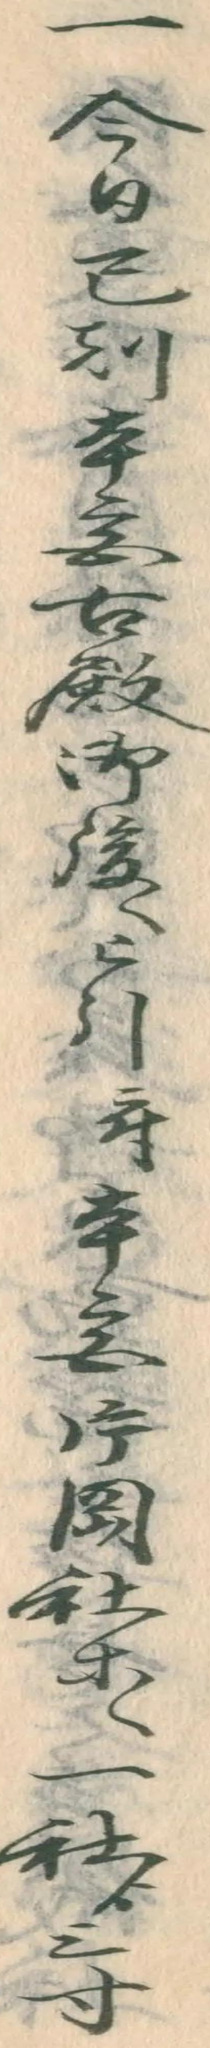一今日巳刻本宮古殿御後へ被引ニ付本宮片岡社等へ一社ゟ三寸
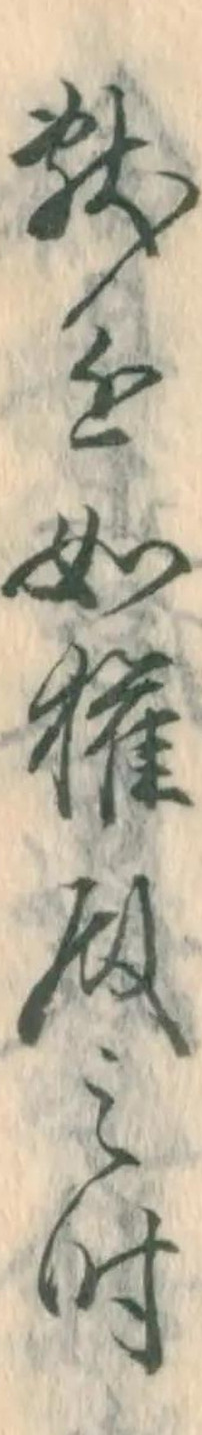献進如権殿之時

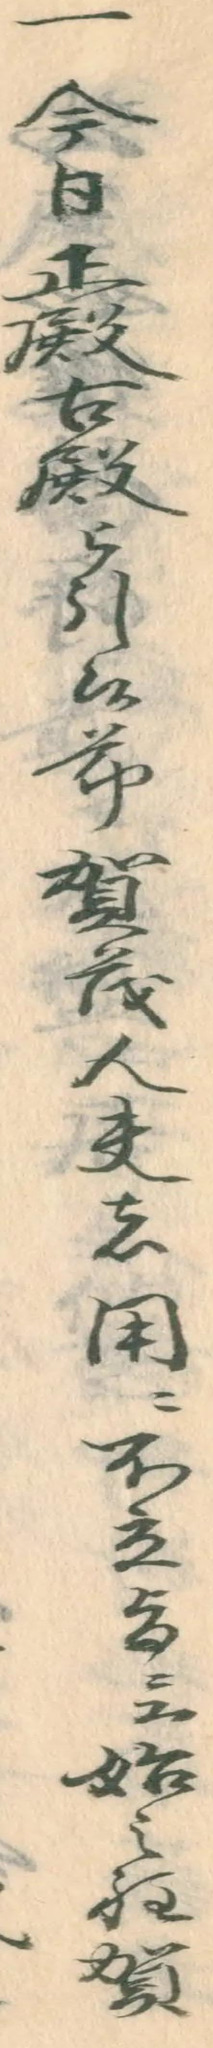一今日正殿古殿被引候節賀茂人夫は用ニ不立旨ニ而始之程賀
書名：賀茂社記録. 第17冊
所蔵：国立国会図書館 National Diet Library, JAPAN
